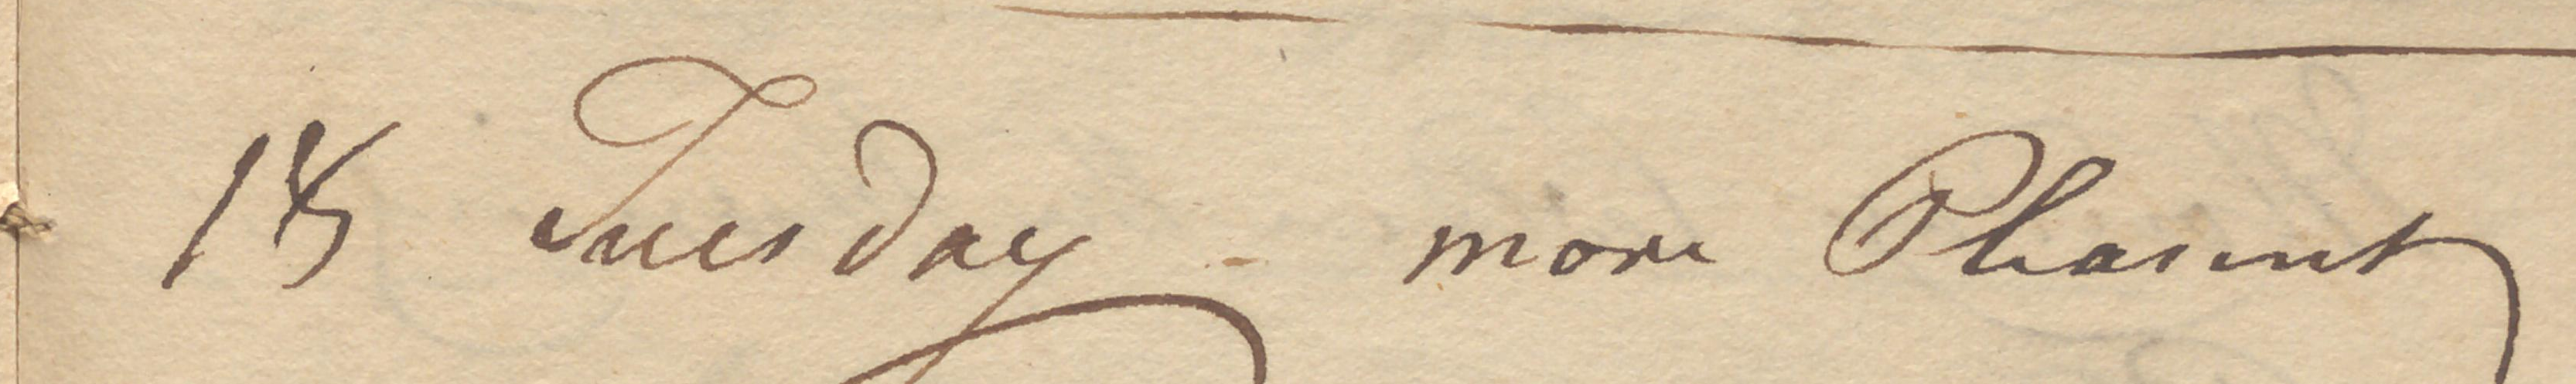18 Tuesday- more Pleasent
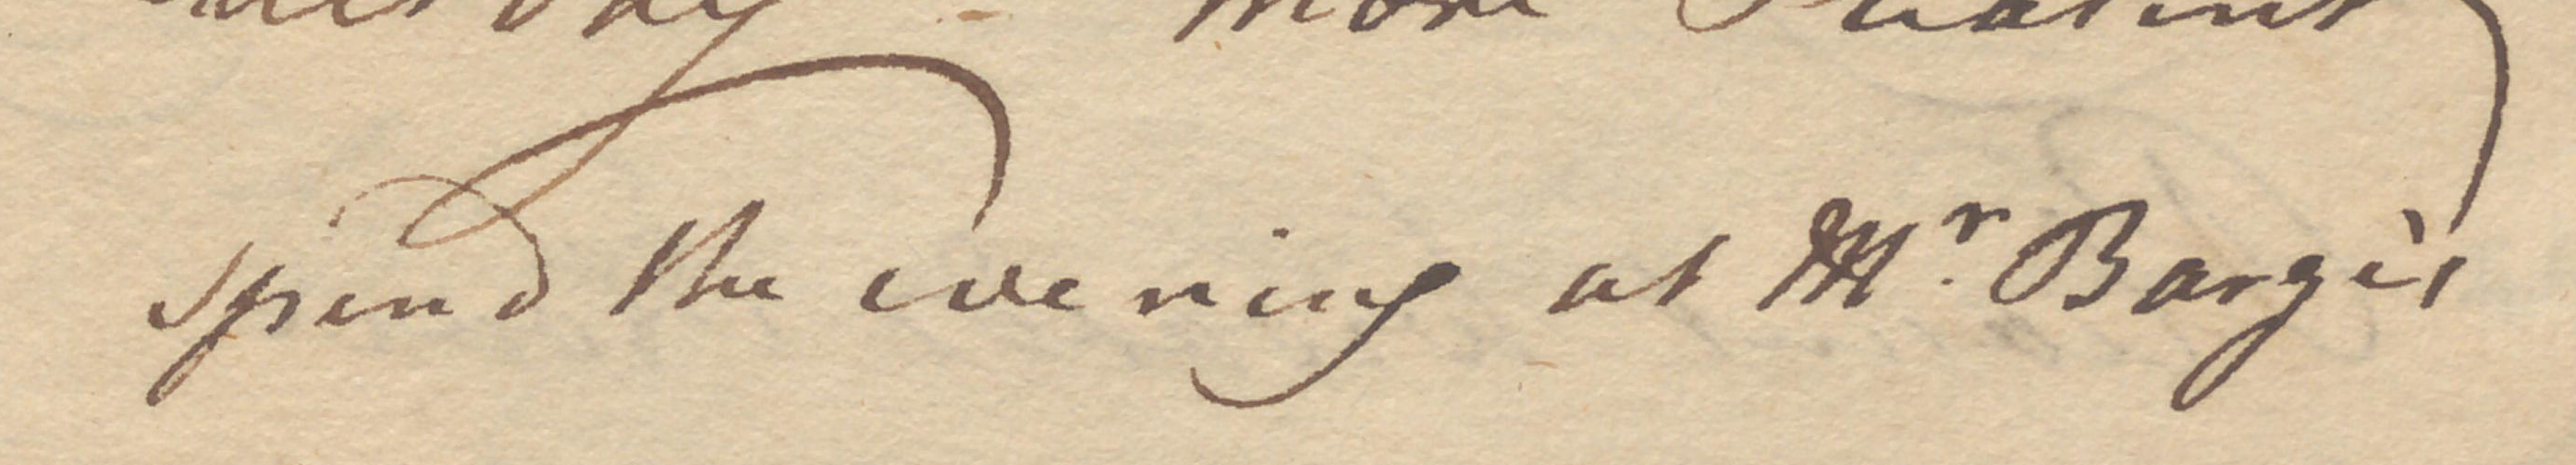spend the evening at M^r. Barge's
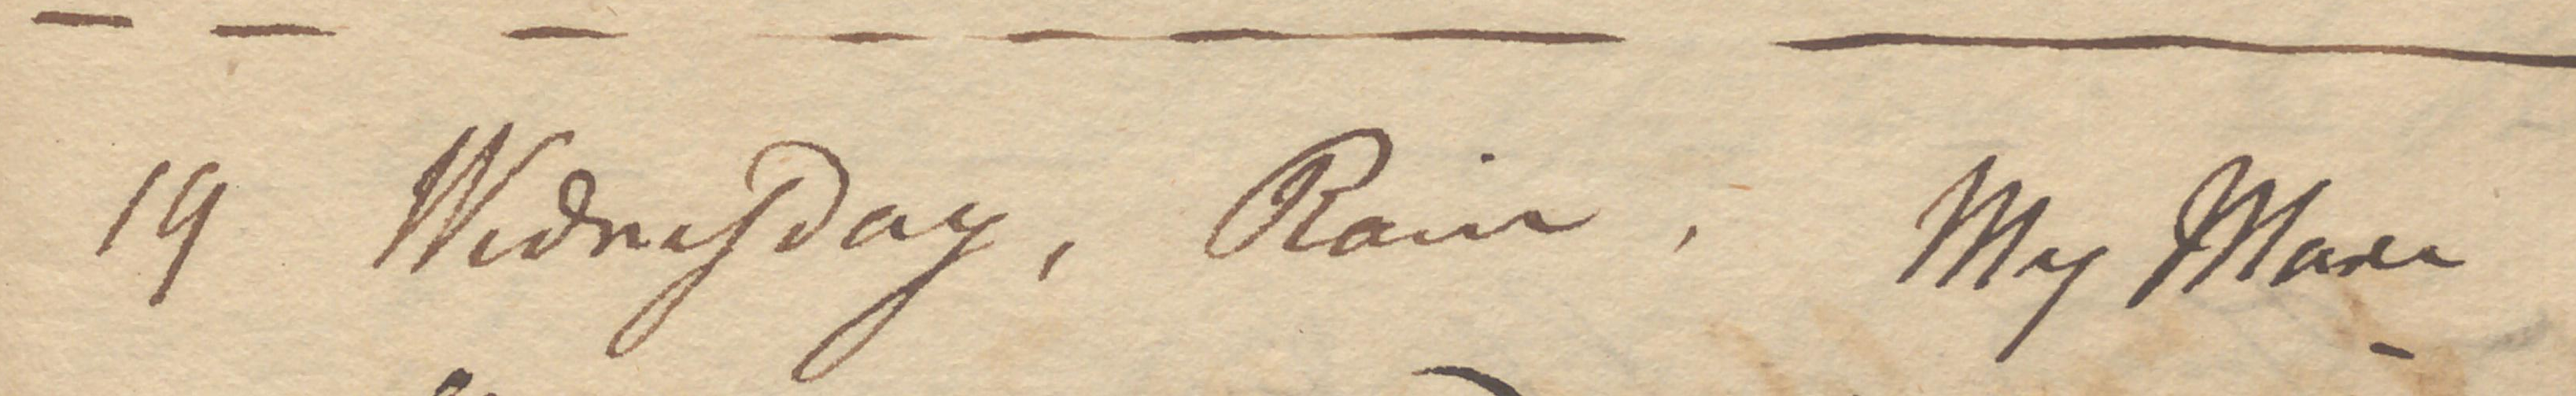19 Wednesday, Rain, My Mare
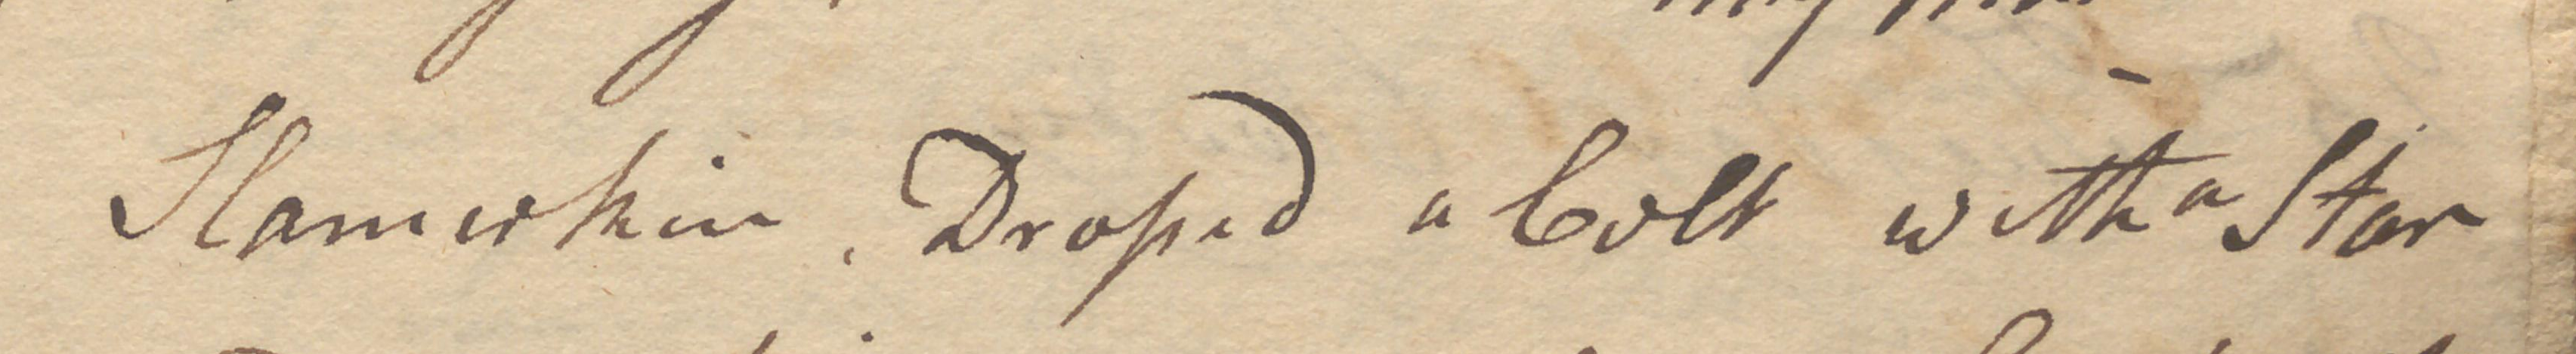Slamerkin. Droped a Colt with a Star
